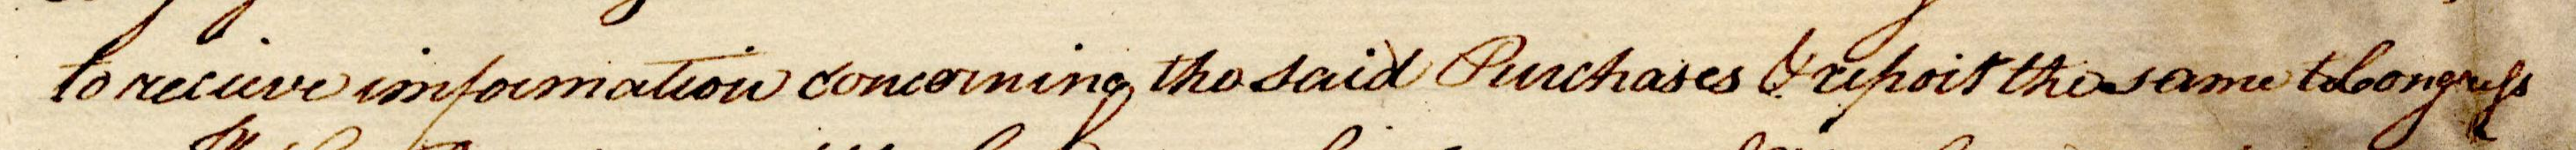to receive information concerning the said Purchases & exploit their same to Congress
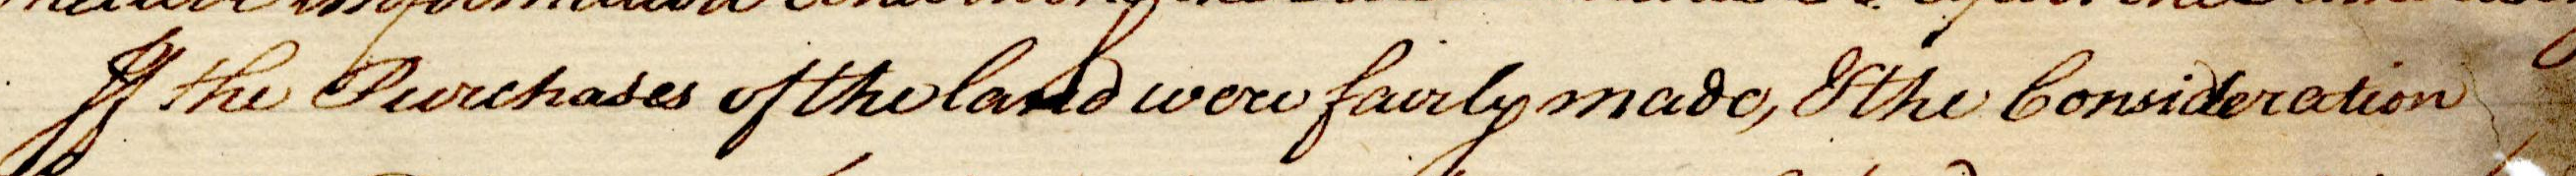If the Purchases of the land were fairly made, & the Consideration
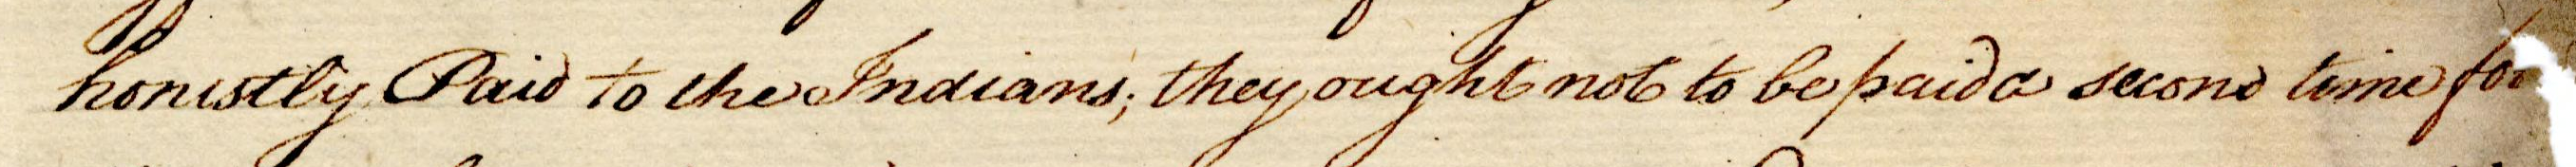honestly Paid to the Indians, they ought not to be paid a second time for
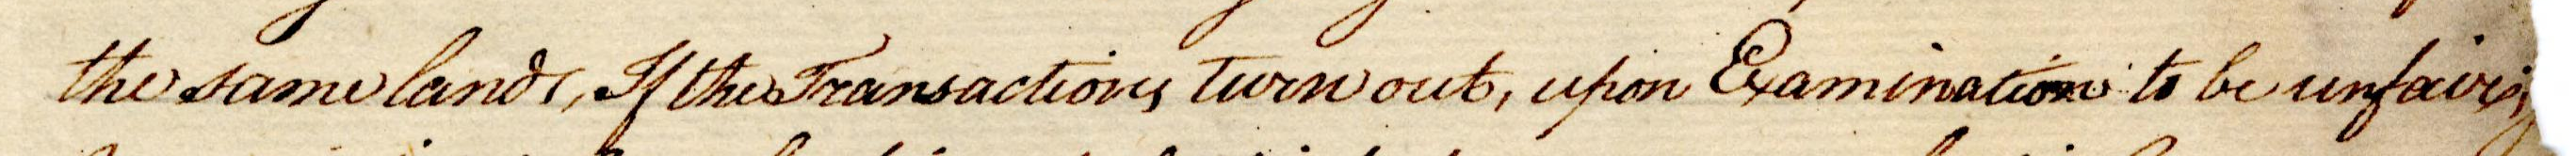the same lands, If the Transactions turn out, upon Examination to be unfair;
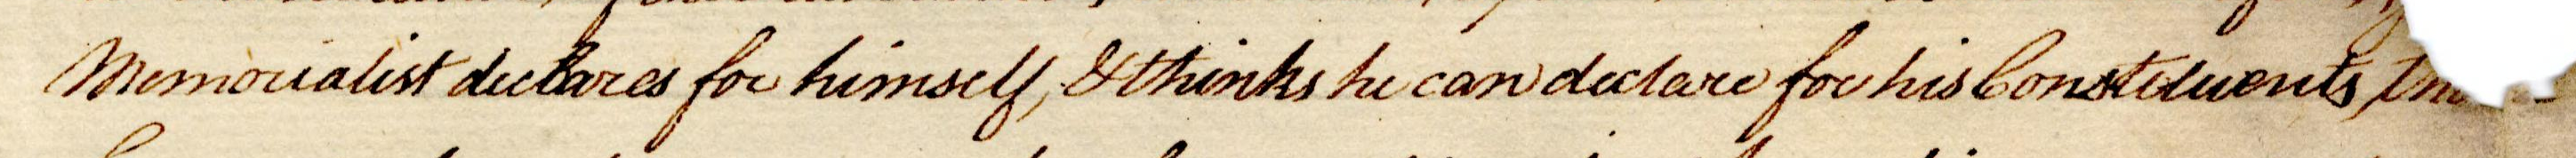Memorialist declares for himself & thinks he can declare for his Constituents the
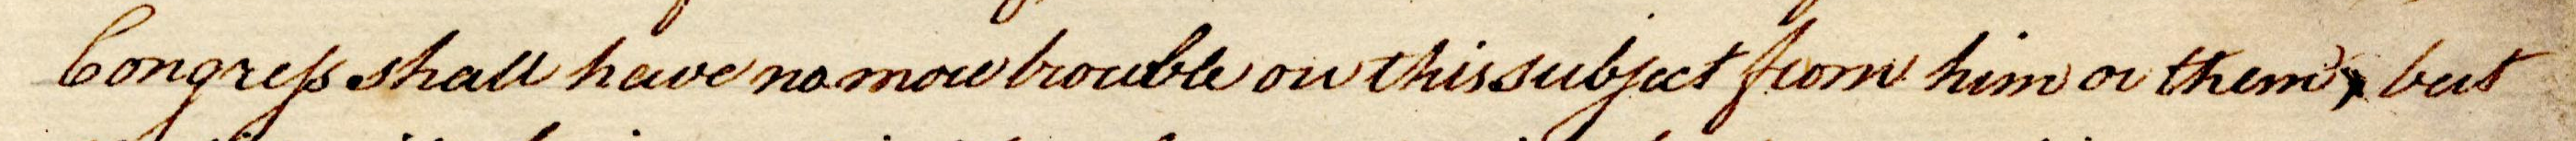Congress shall have no more trouble on this subject from him or them but
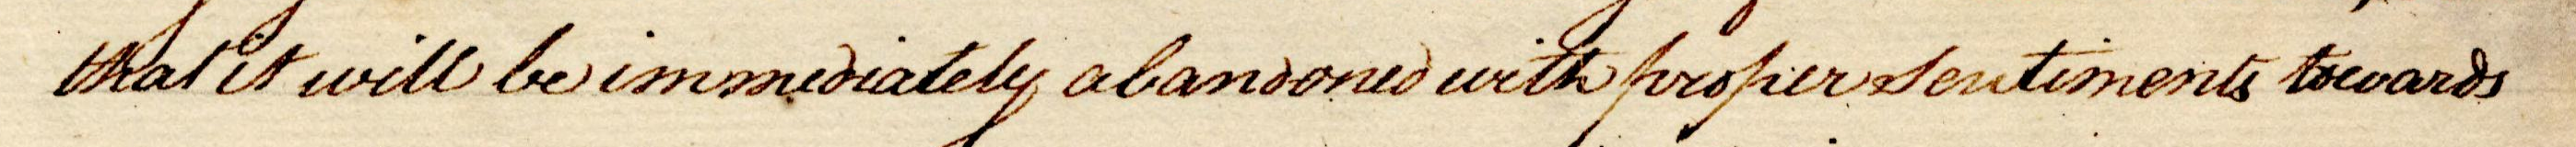that it will be immediately abandoned with proper sentiments towards
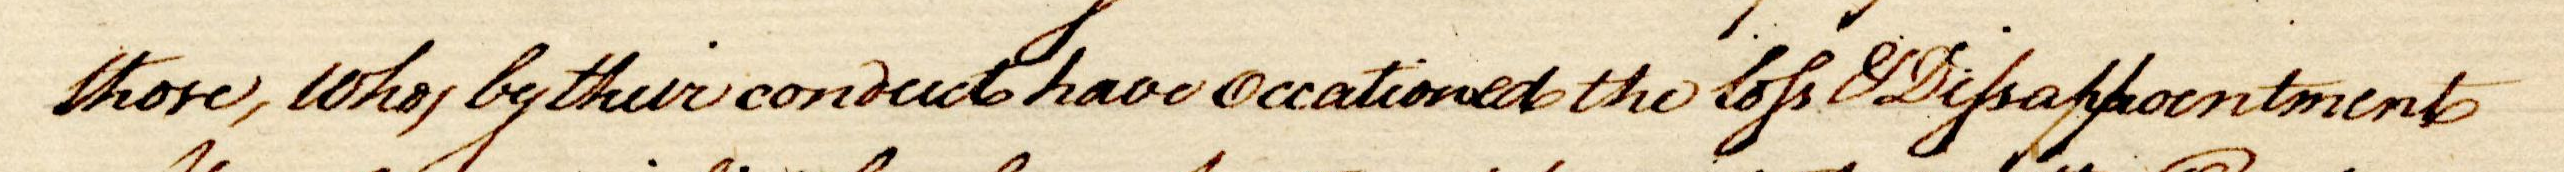those, who, by their conduct have occasioned the loss & Disappointment
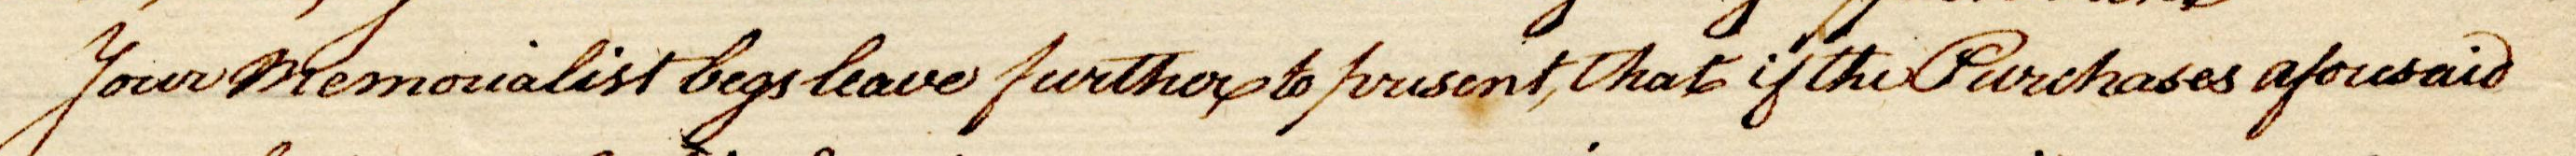Your Memorialist begs leave further to present, that if the Purchases aforesaid
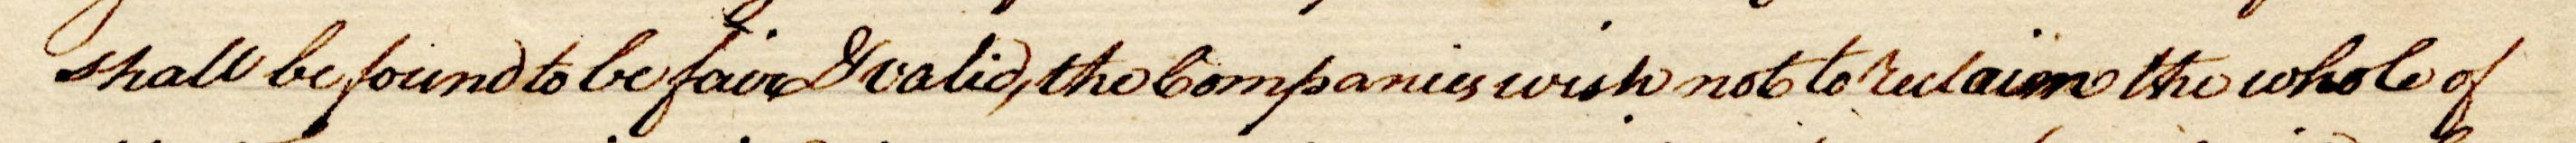shall be found to be fair & valid, the Companies wish not to reclaim the whole of
